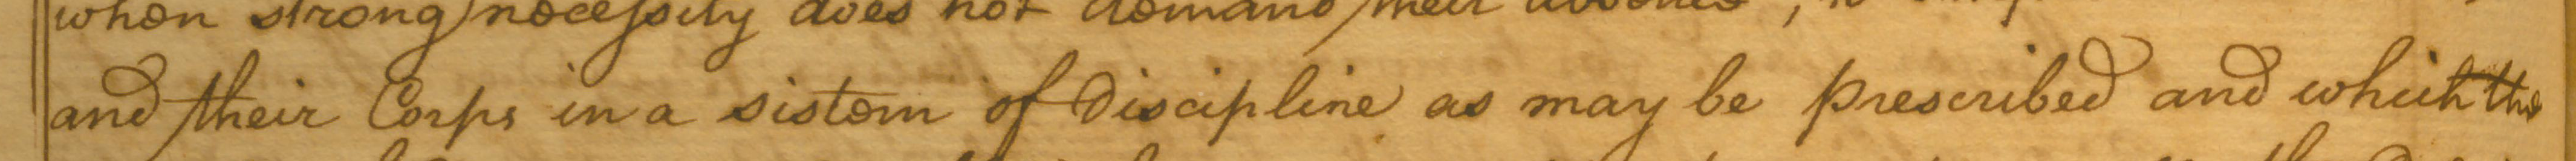and their Corps in a sistem of discipline as may be prescribed and which the
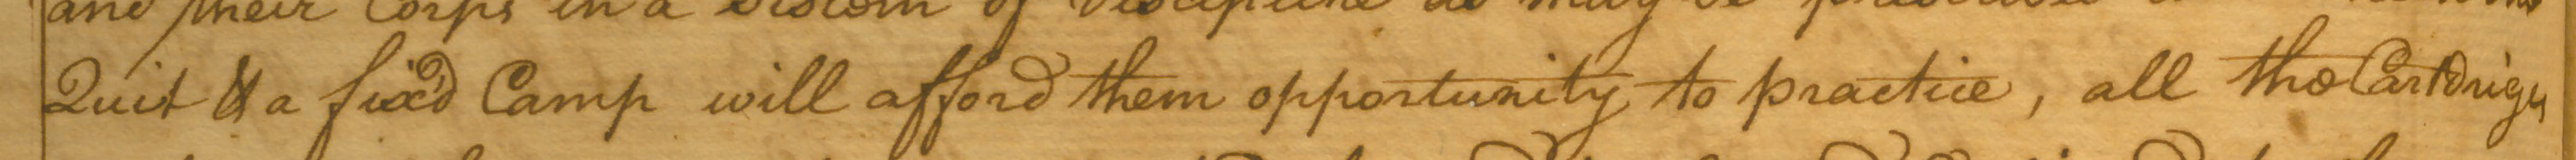Quit & a fix'd Camp will afford them opportunity to practice, all the Cartridges
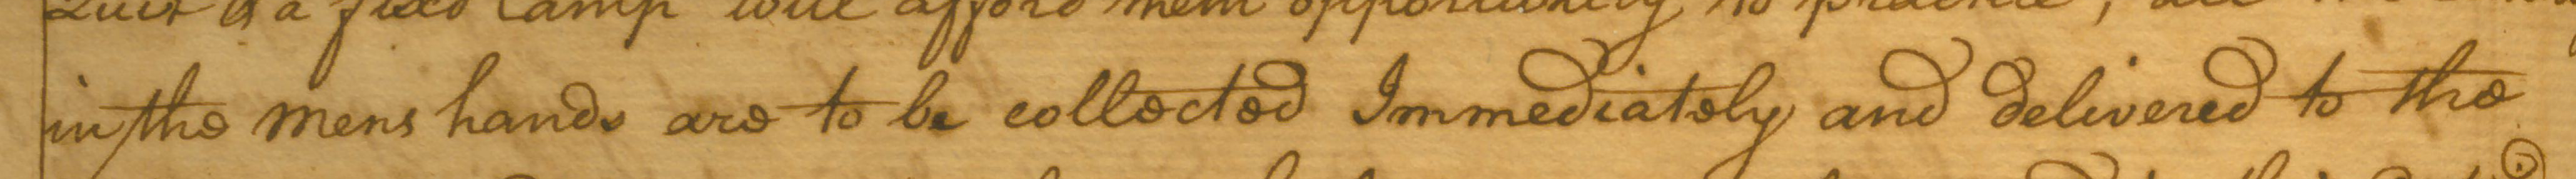in the mens hands are to be collected Immediately and delivered to the
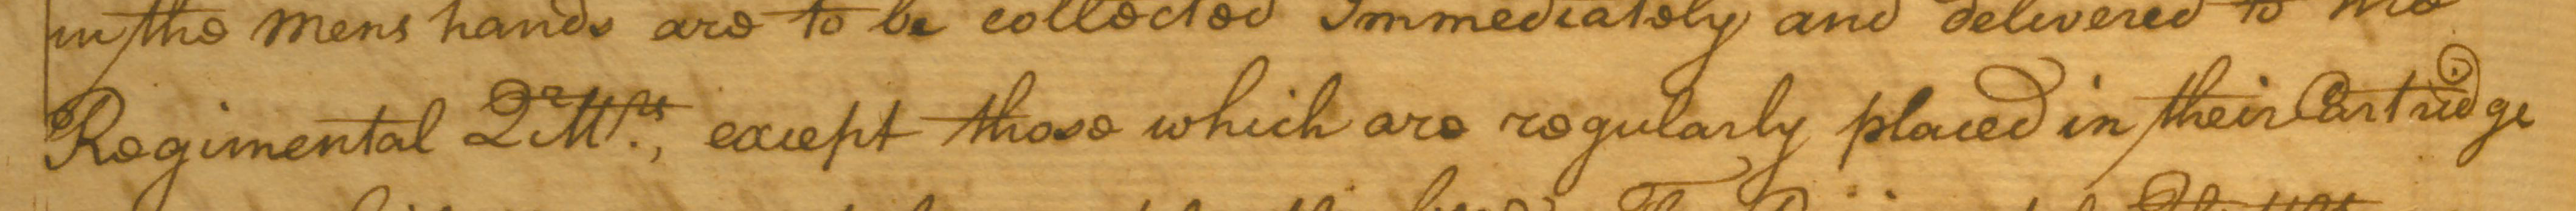Regimental Q^r. M^rs., except those which are regularly placed in their Cartridge
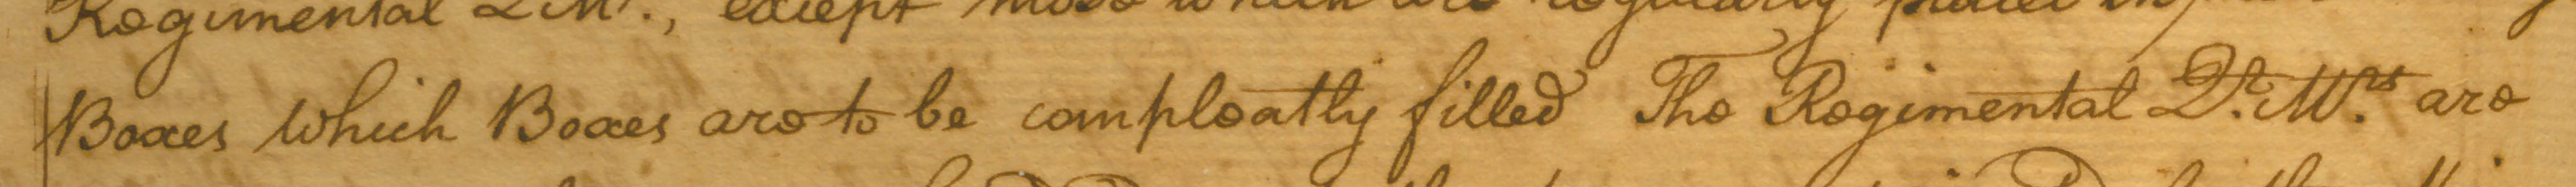Boxes which Boxes are to be compleatly filled The Regimental Q^r. M^rs. are
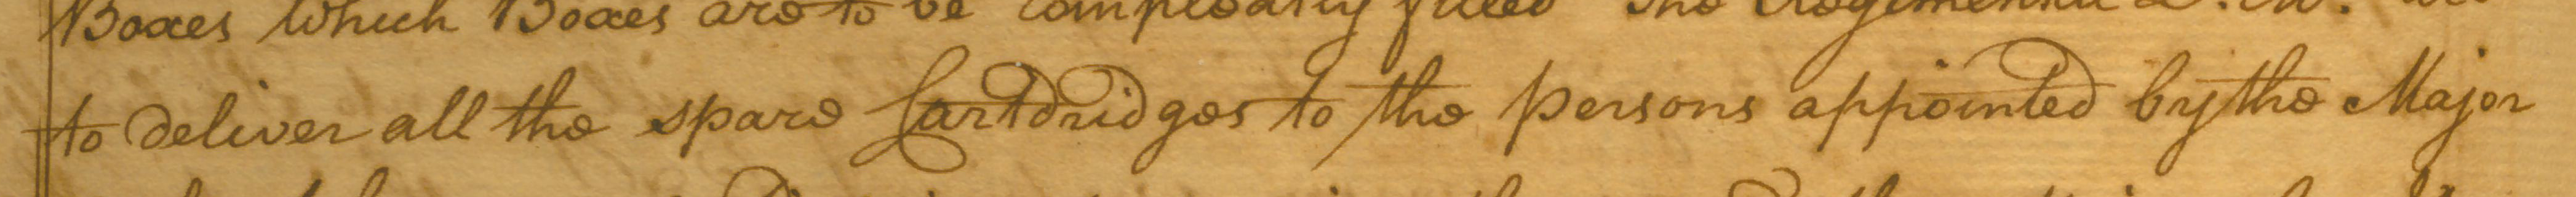to deliver all the spare Cartridges to the persons appointed by the Major
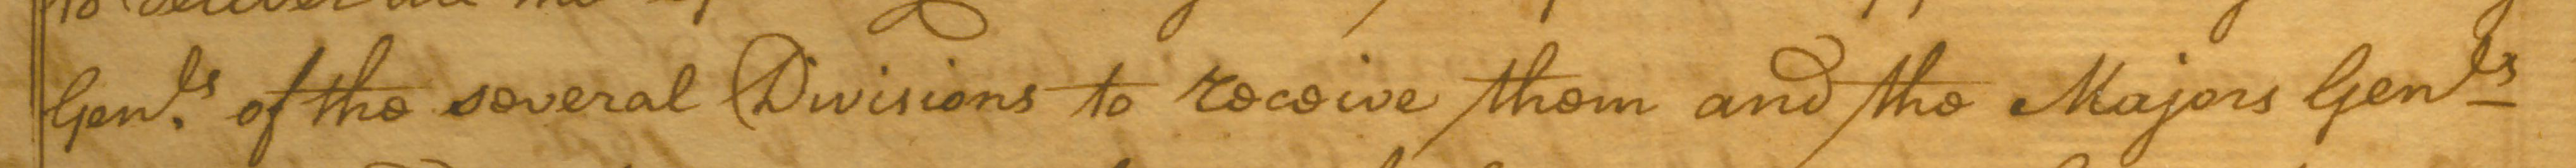Gen^ls. of the several Divisions to receive them and the Majors Gen^ls
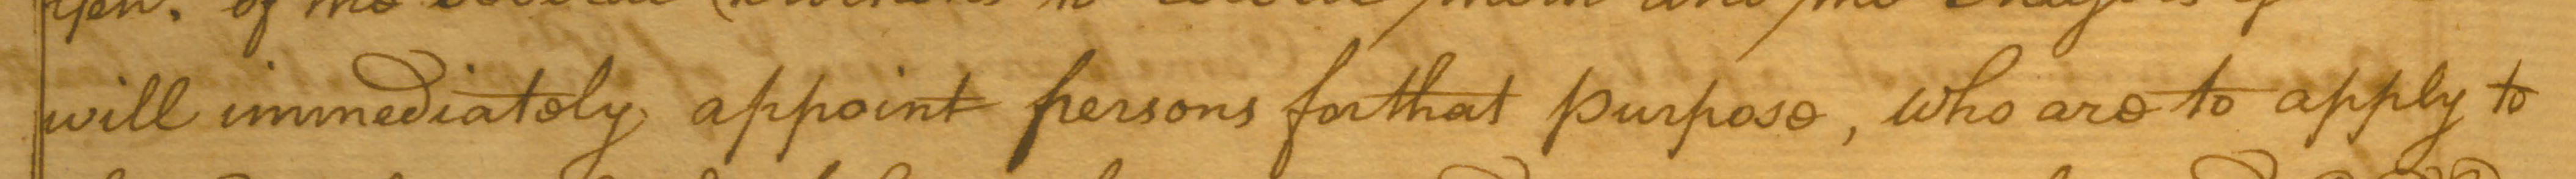will immediately appoint persons for that purpose, who are to apply to
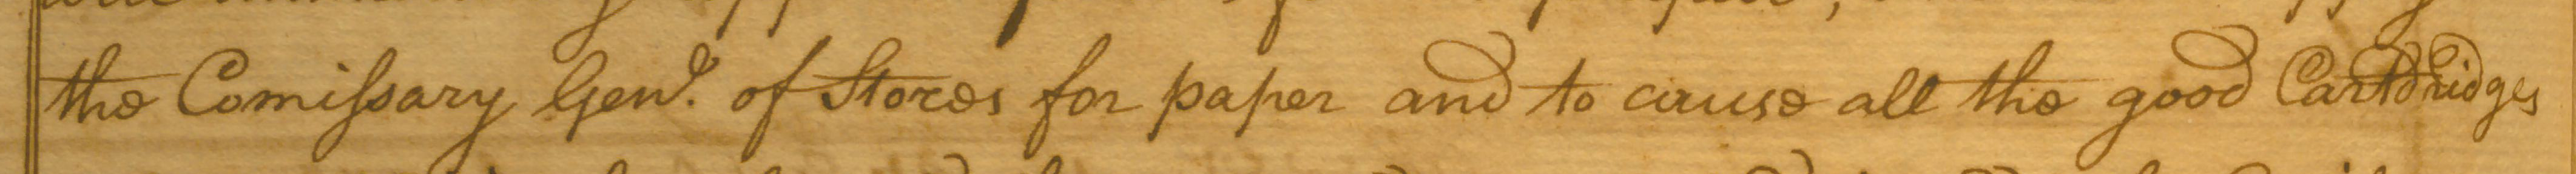the Comissary Gen^l. of Stores for paper and to cause all the good Cartridges
